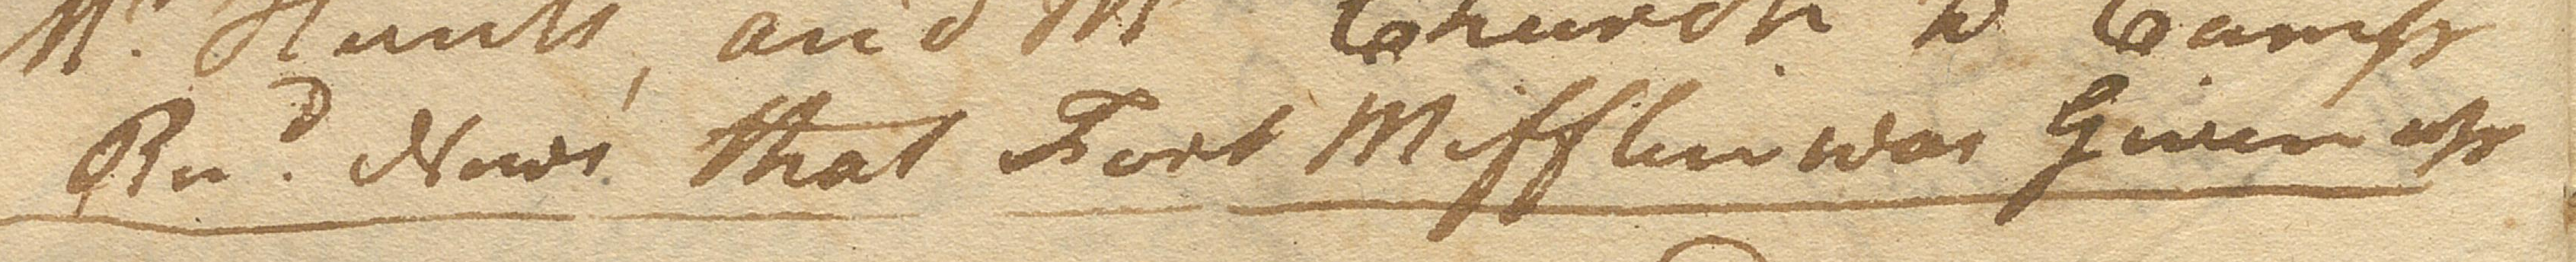Re^d. News that Fort Mifflin was Given up
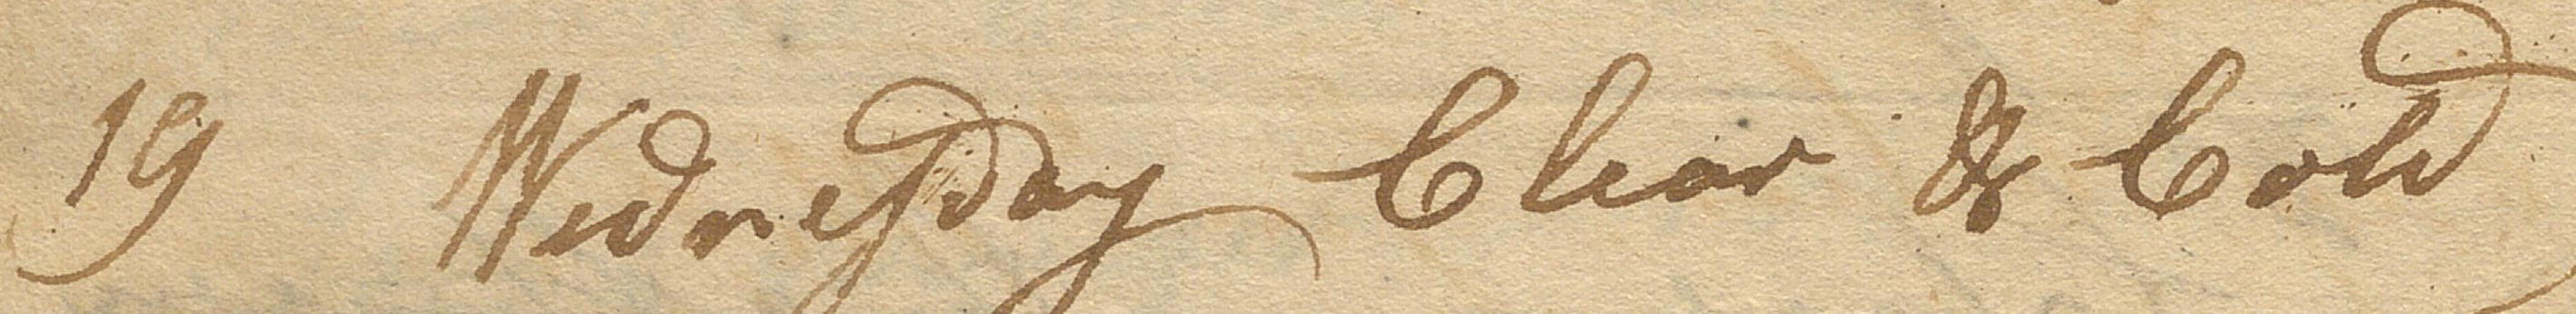19 Wednesday Clear & Cold
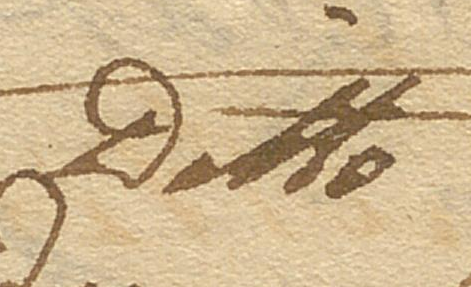Ditto
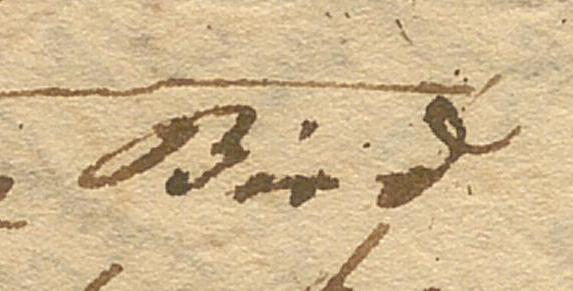Bird
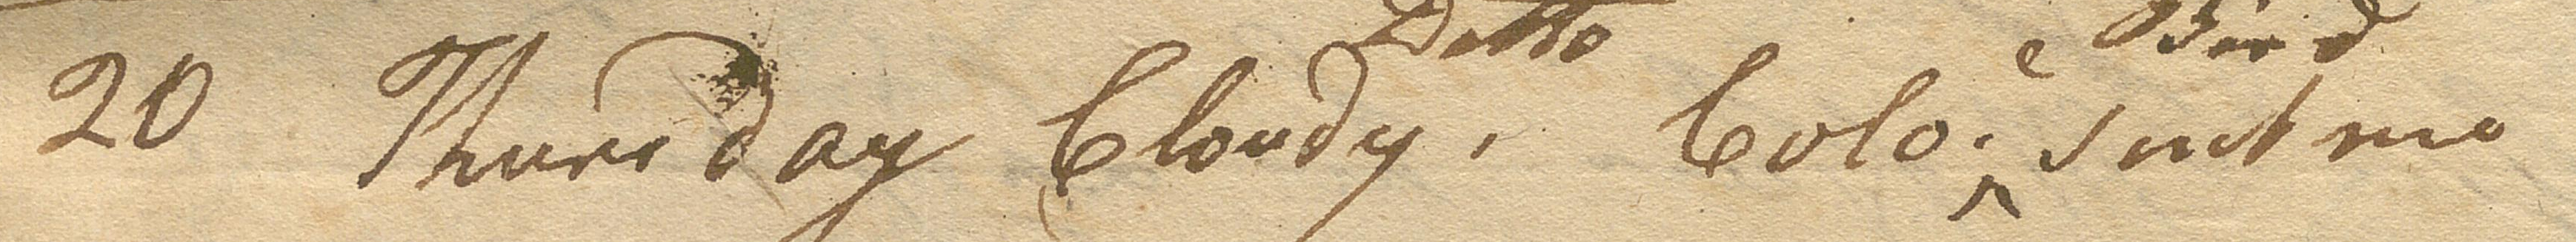20 Thursday Cloudy. Colo. ^ sent me
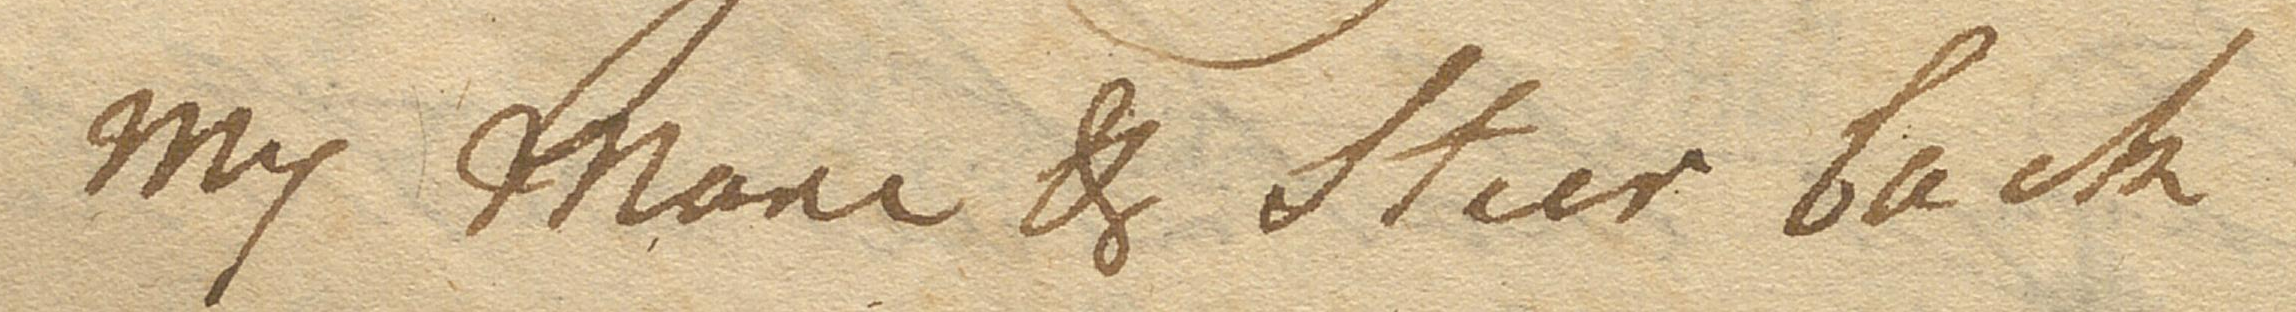my Mare & Steer back
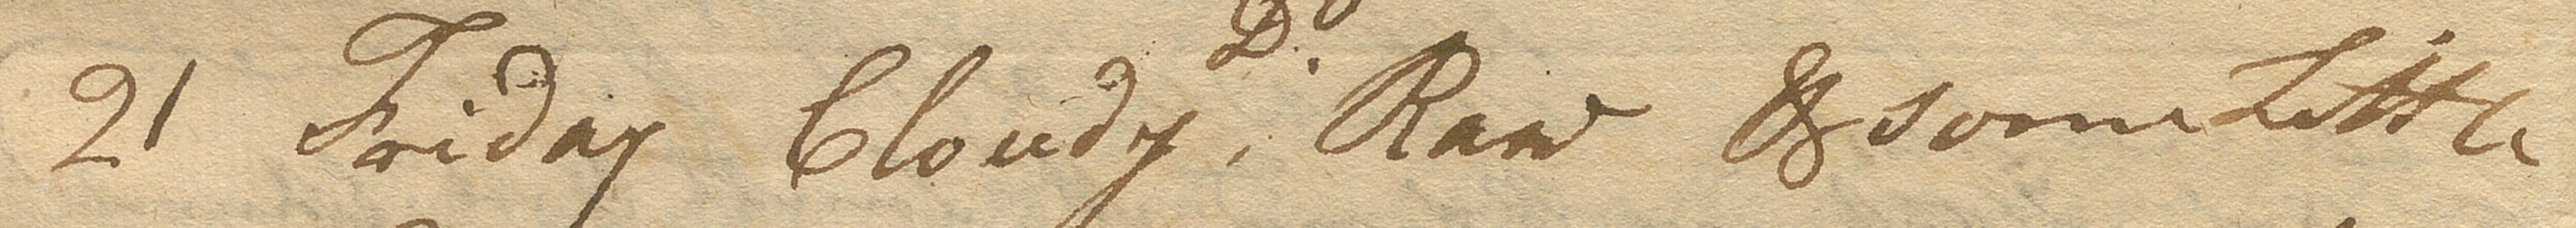21 Friday Cloudy. Raw & some Little
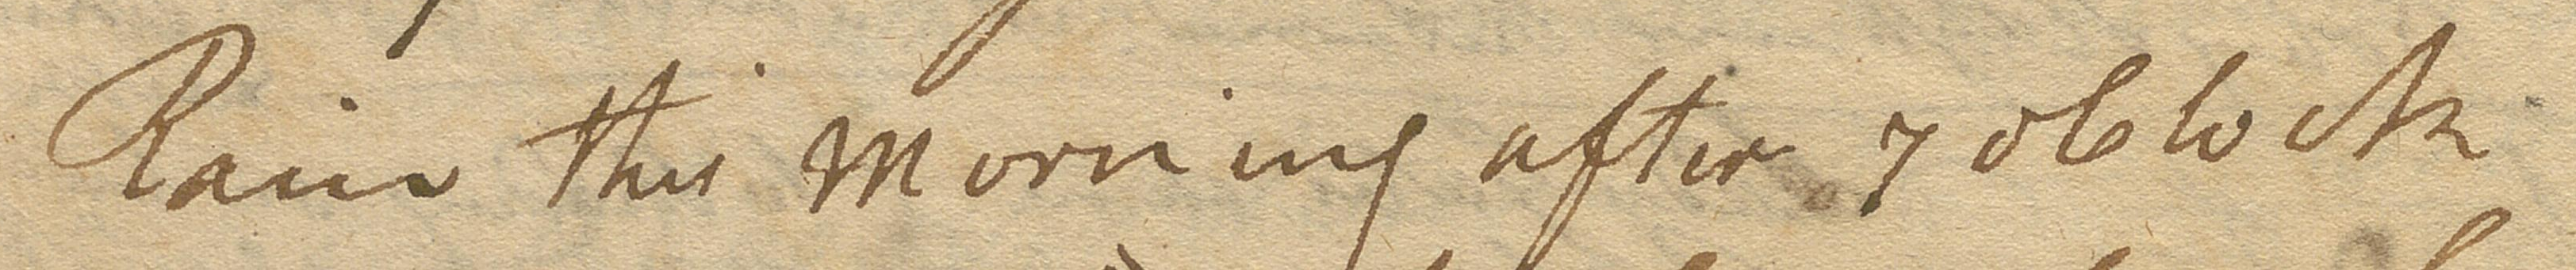Rain this Morning after 7 oClock
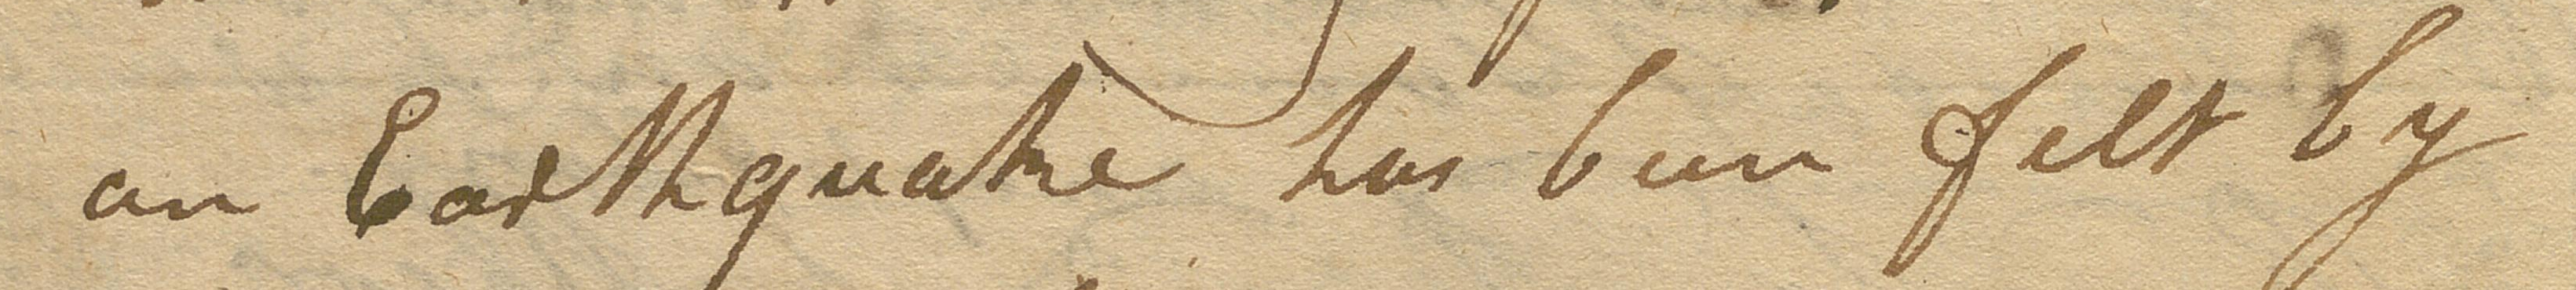an Earthquake has been felt by
